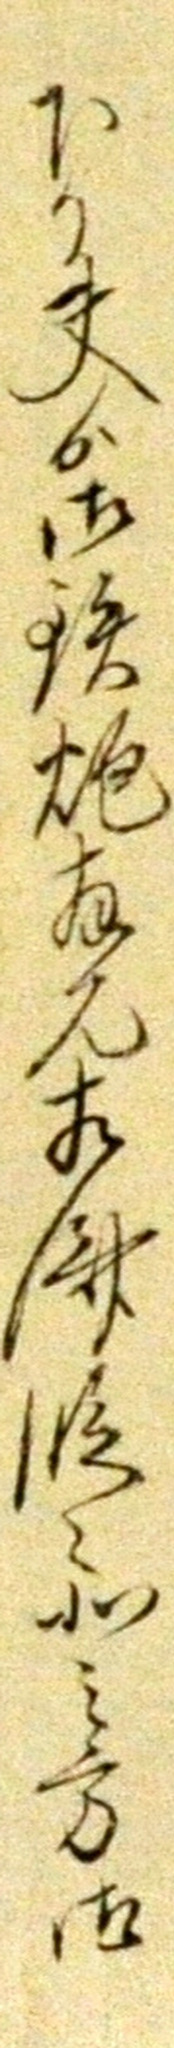下り夫ゟ御鉄砲拝見相済段々北之方御
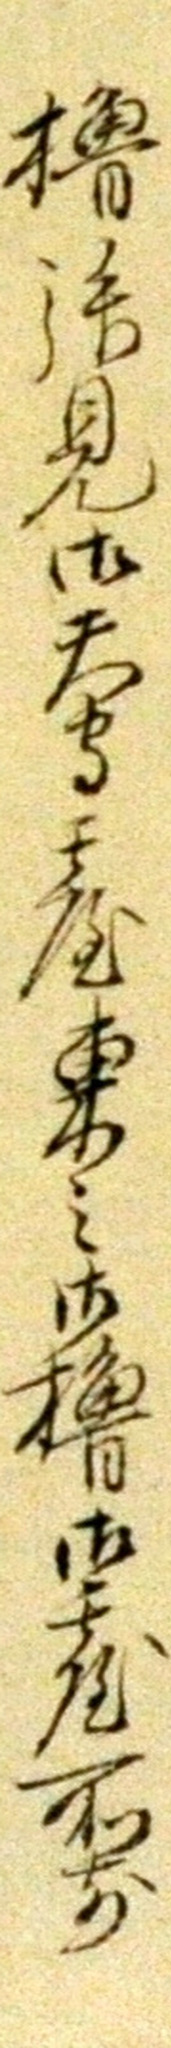櫓拝見御天守台東之御櫓御台所前
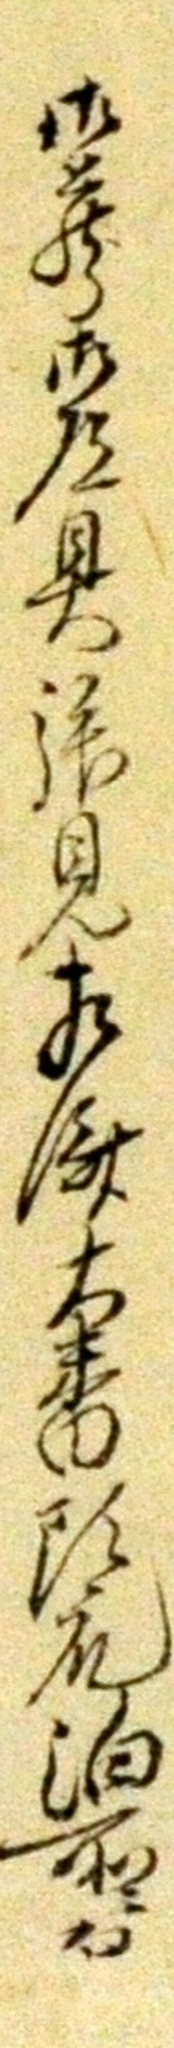御蔵御道具拝見相済大番頭衆泊所ニ而
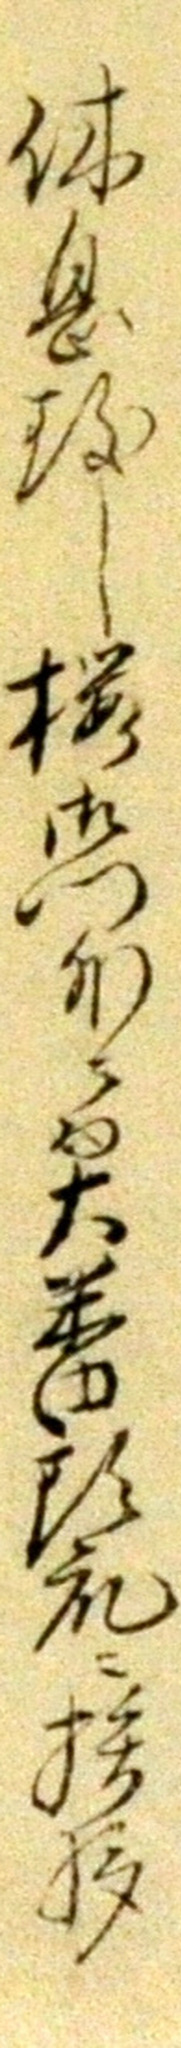休息致し楼御門外ニ而大番頭衆ニ挨拶
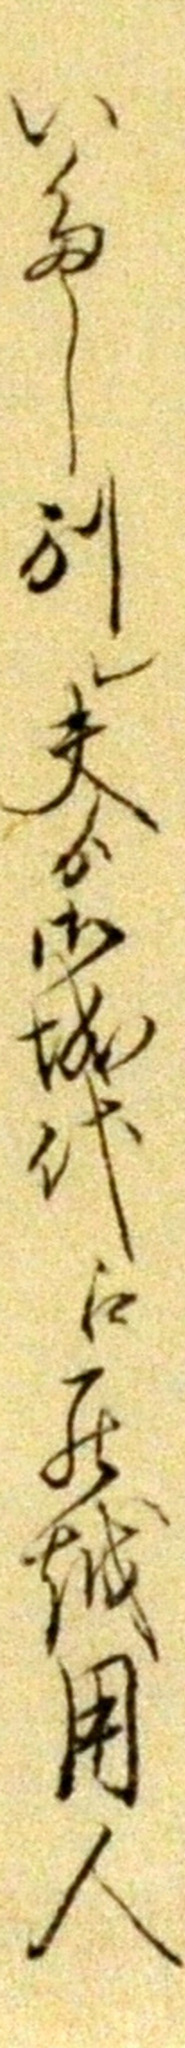いたし別レ夫ゟ御城代え罷越用人
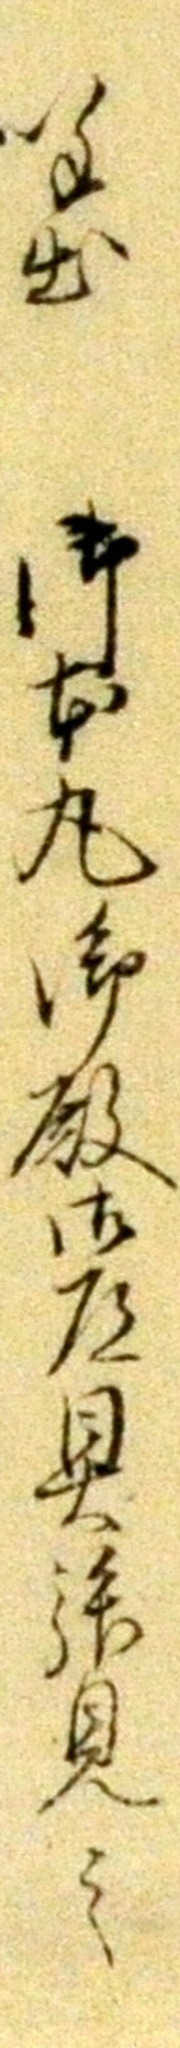呼出御本丸御殿御道具拝見之
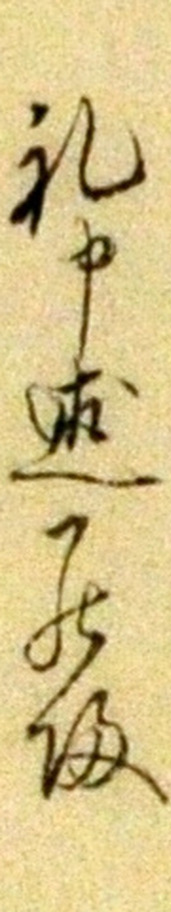礼申述罷帰
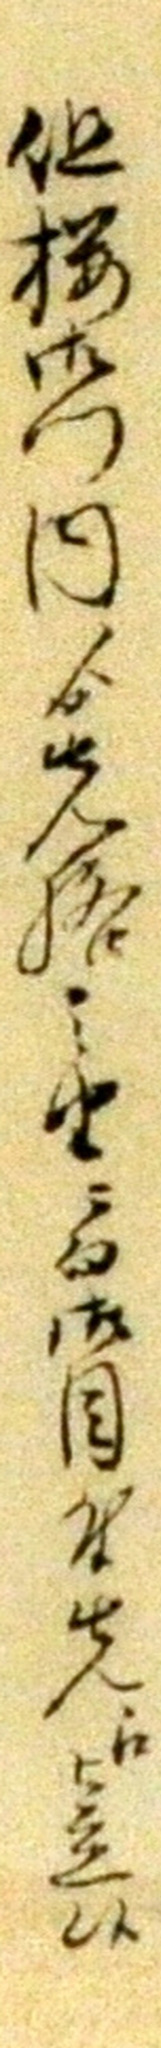但楼御門内ゟ先格之由ニ而御目付先え被立候
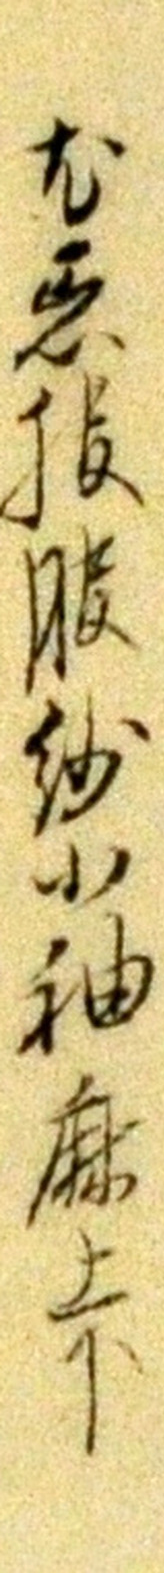尤着服服紗小袖麻上下

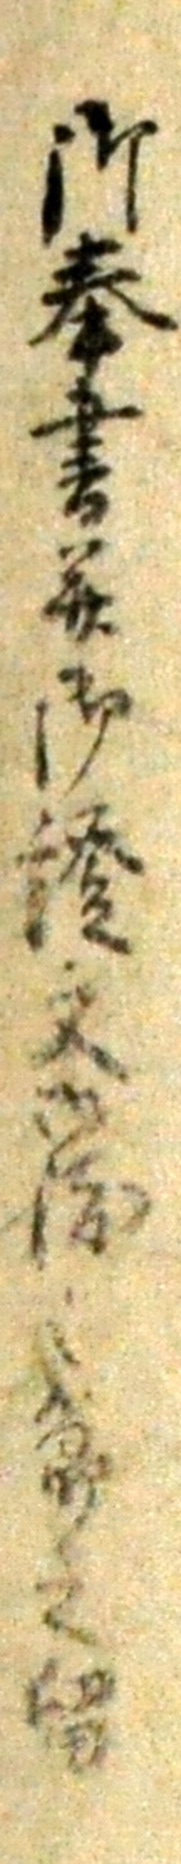御奉書并御證文御渡之節之留
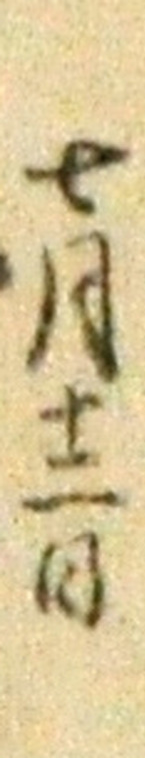七月十二日
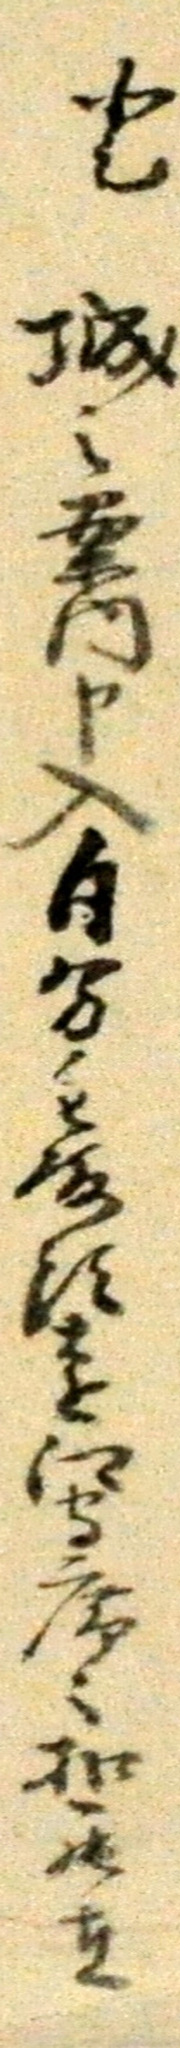登城之案内申入自分主殿頭遠江守席々扣罷在
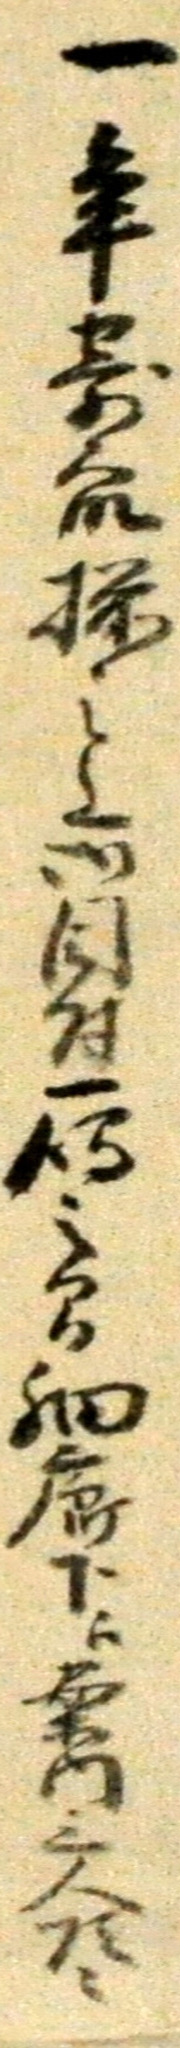一年寄衆揃之上御目付雁之間細廊下え案内三人順々
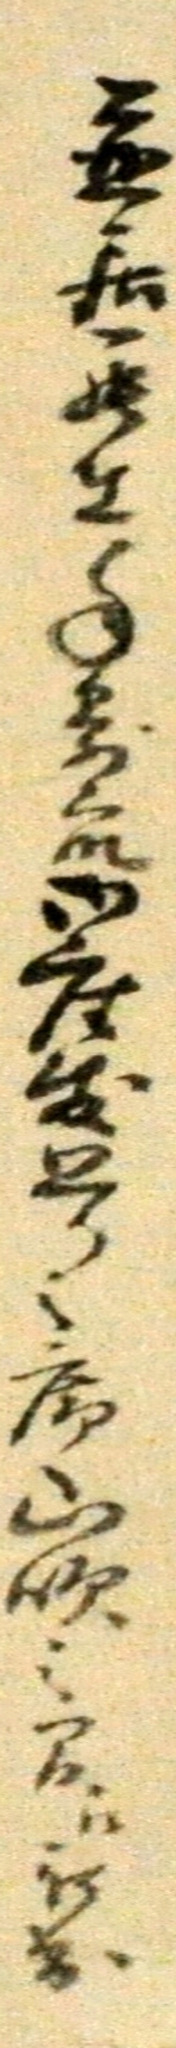並居罷在年寄衆御座敷廻り之席山吹之間え被出
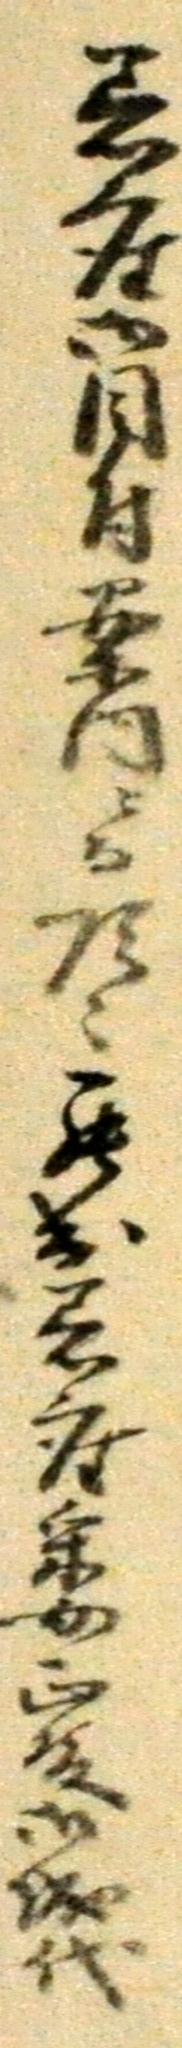着座御目付案内ニ而順々罷出着座采女正殿御城代
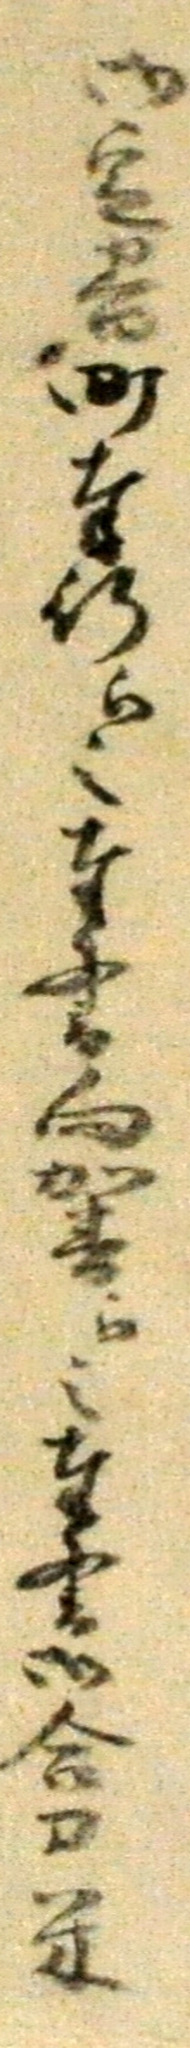御定番町奉行え之奉書向加番え之奉書御合力米
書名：大阪加番関係諸書留〔一括〕
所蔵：伊那市立高遠町図書館・合同会社AMANE
